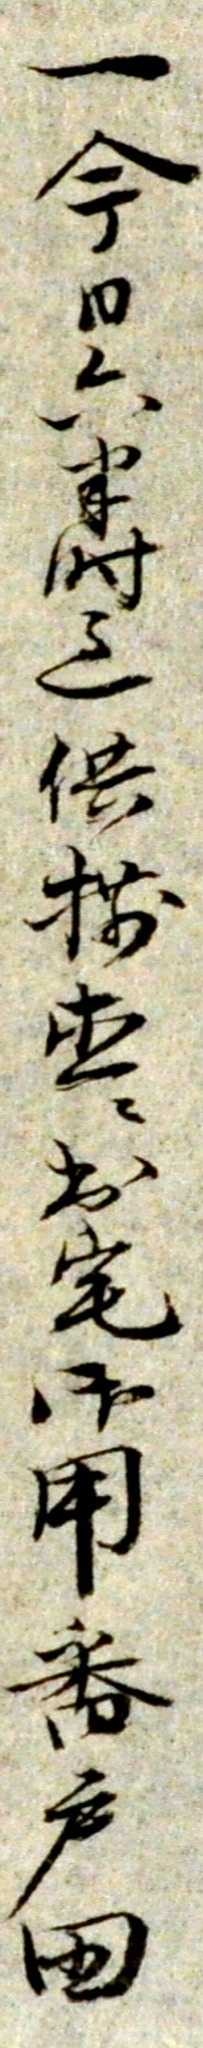一今日六半時過供揃直ニ出宅御用番戸田
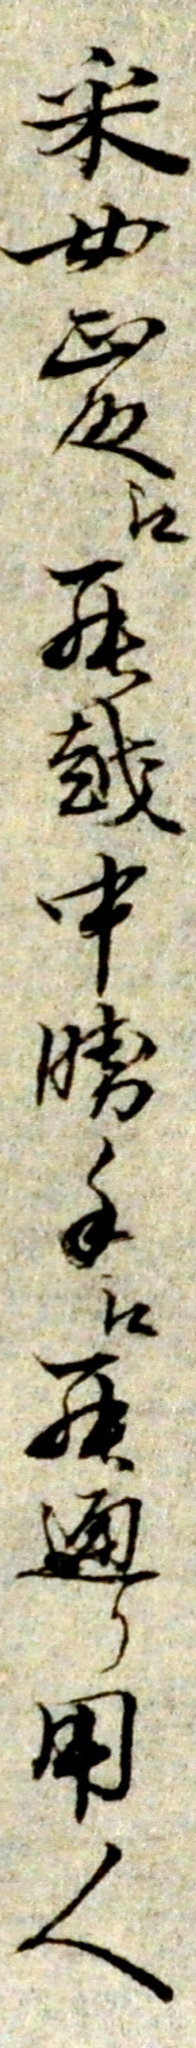采女正殿え罷越中勝手え罷通り用人
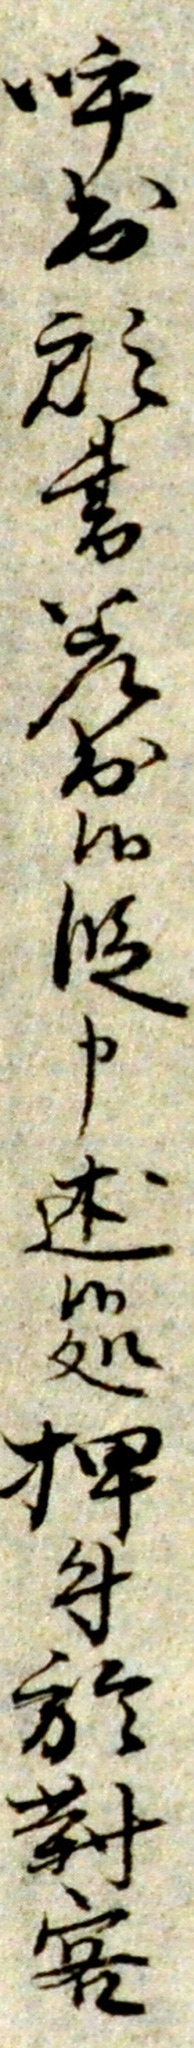呼出願書差出候段申述候処押付於対客
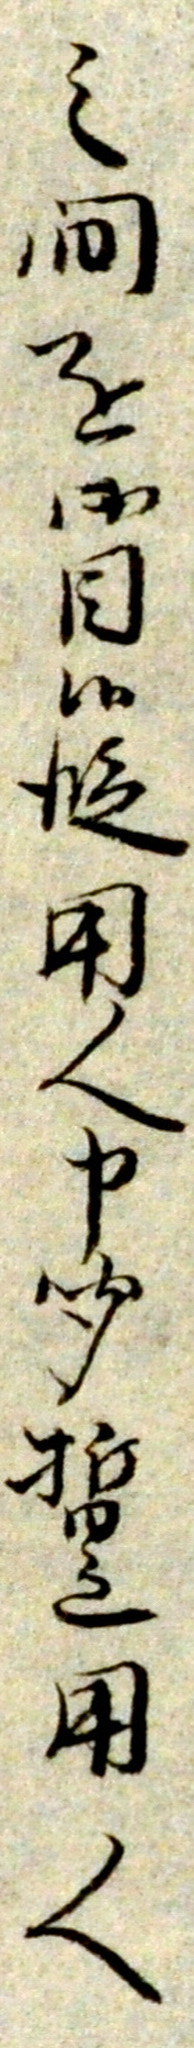之間懸御目候段用人申聞暫過用人
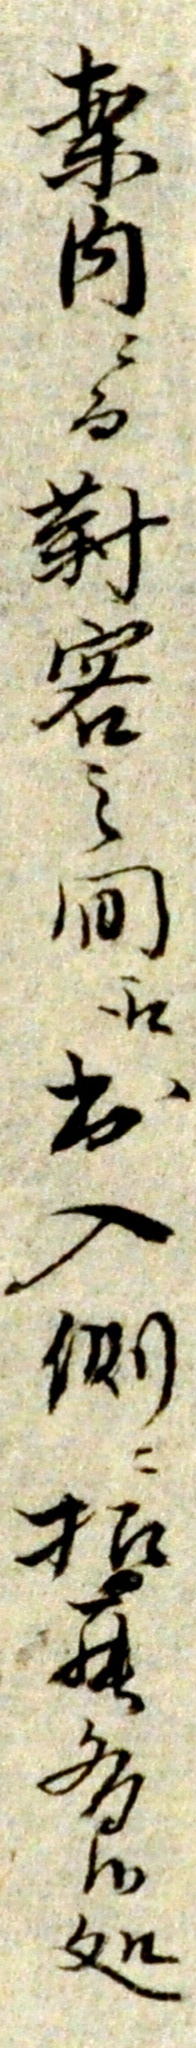案内ニ而対客之間え出入側ニ扣罷有候処

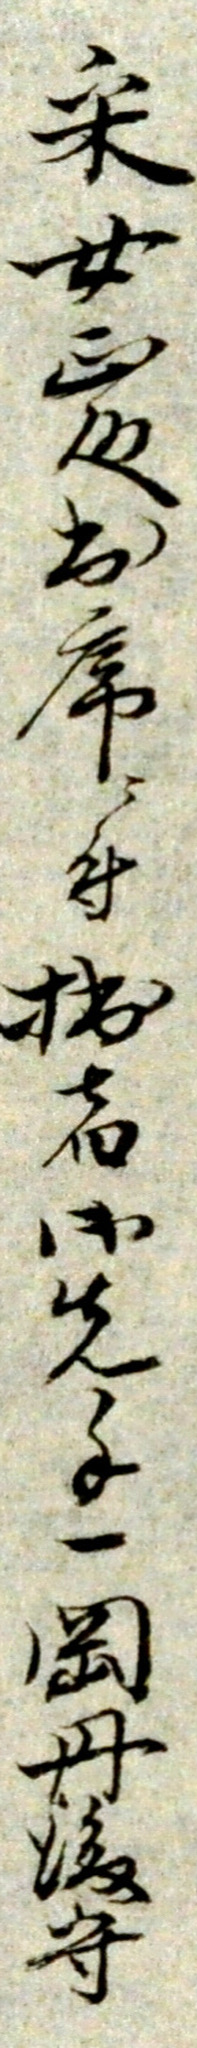采女正殿出席ニ付拙者御先手一岡丹後守
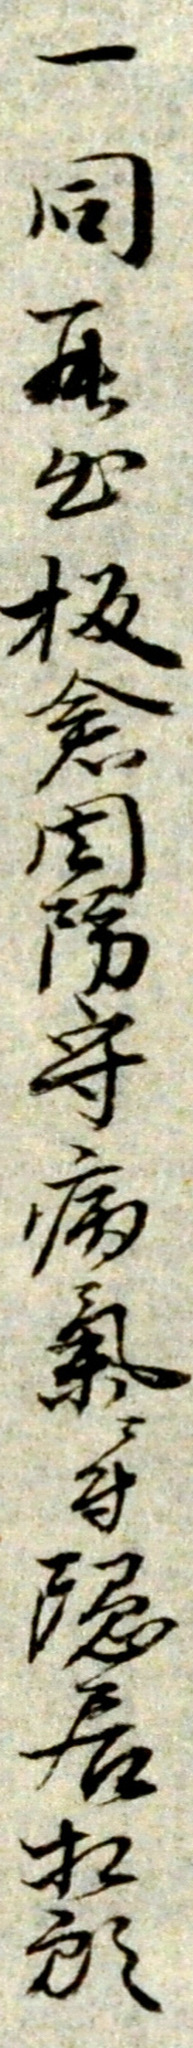一同罷出板倉周防守病気ニ付隠居相願
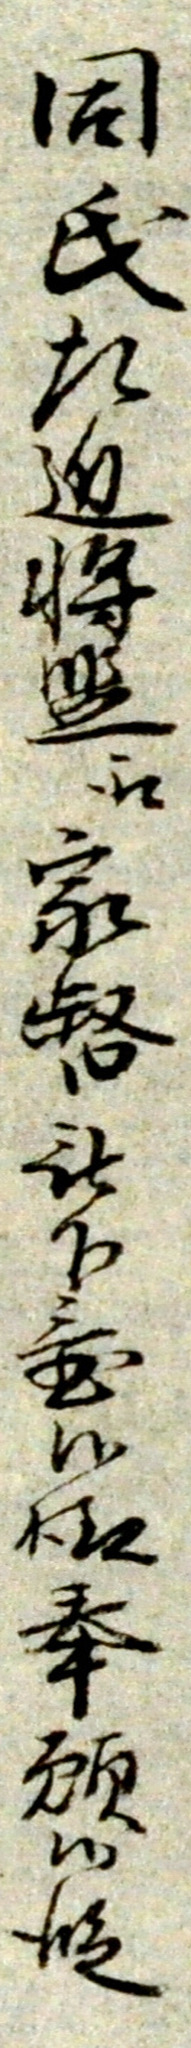同氏左近将監え家督被下置候様奉願候段
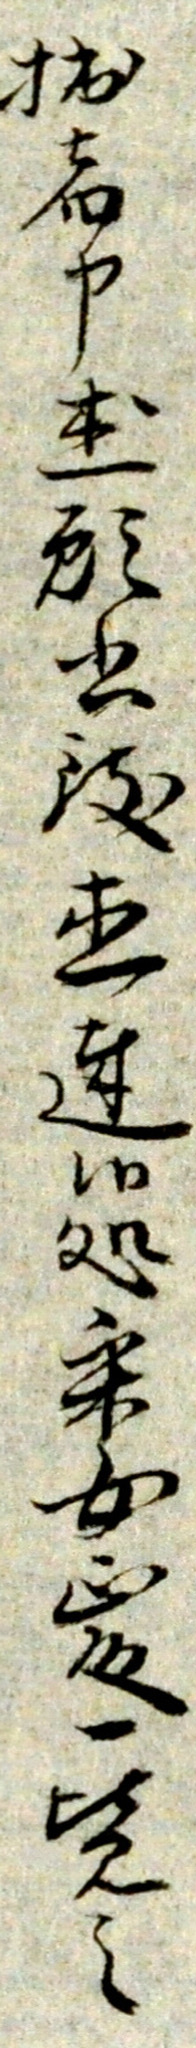拙者申述願書致直達候処采女正殿一覧之
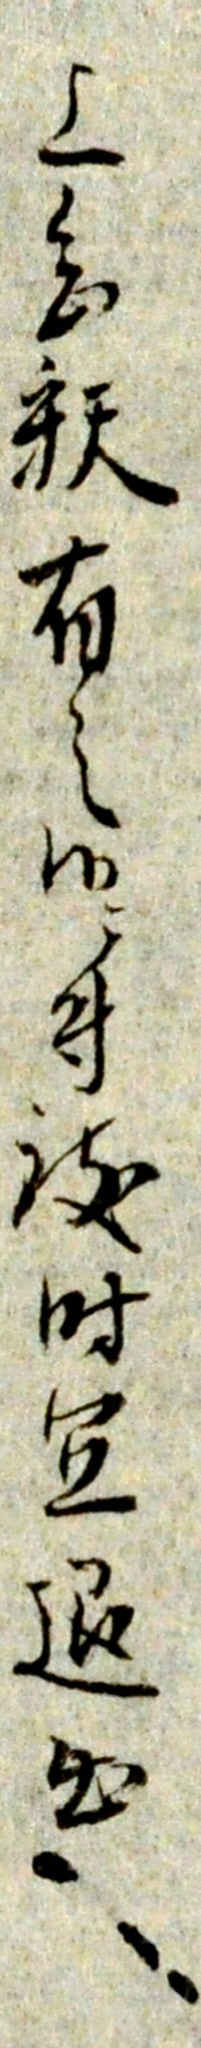上会釈有之候ニ付致時宜退出
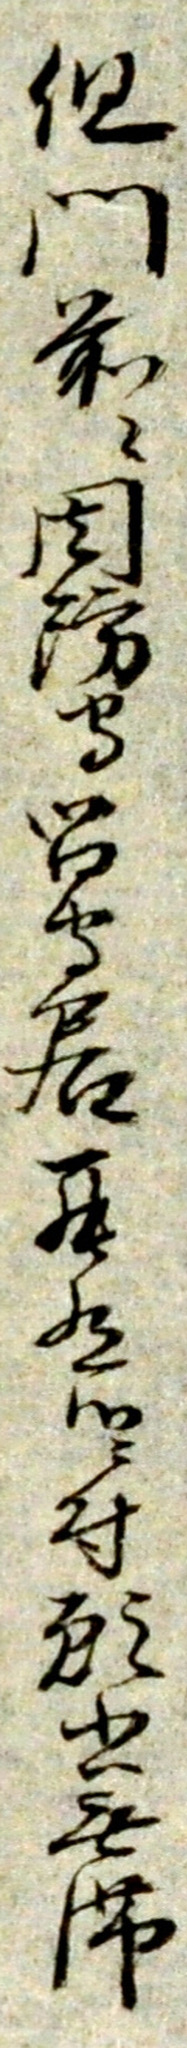但門前ニ周防守留守居罷有候ニ付願書無滞
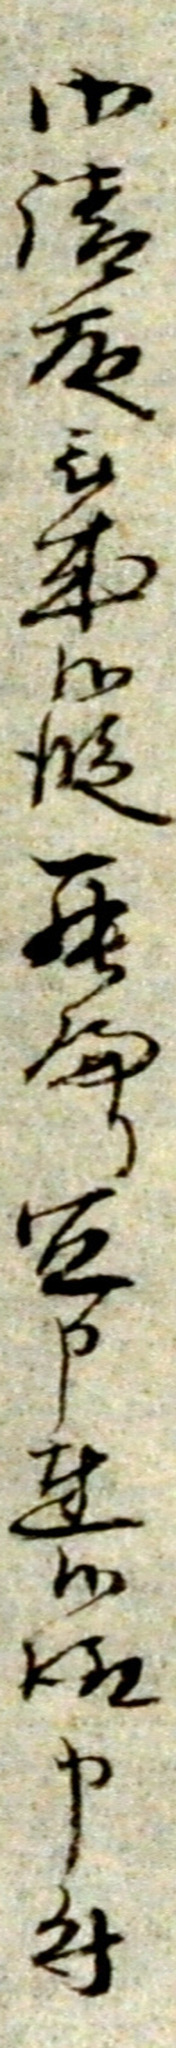御請取被成候段罷帰り宜申達候様申付
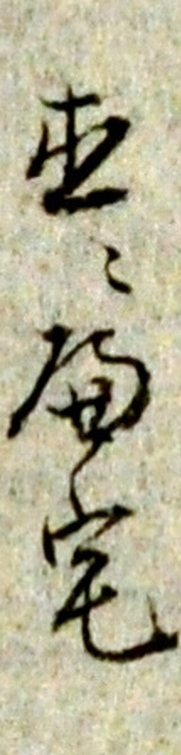直ニ帰宅
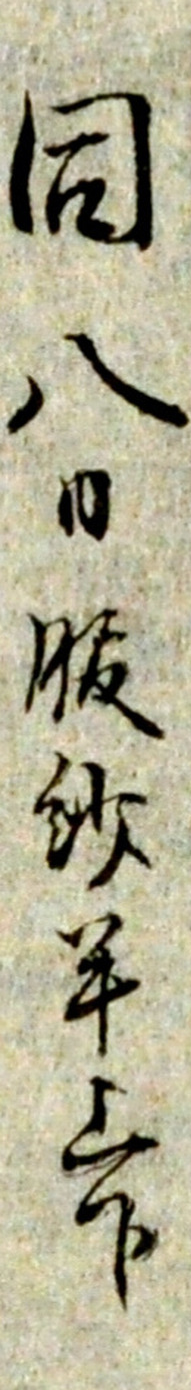同八日服紗半上下
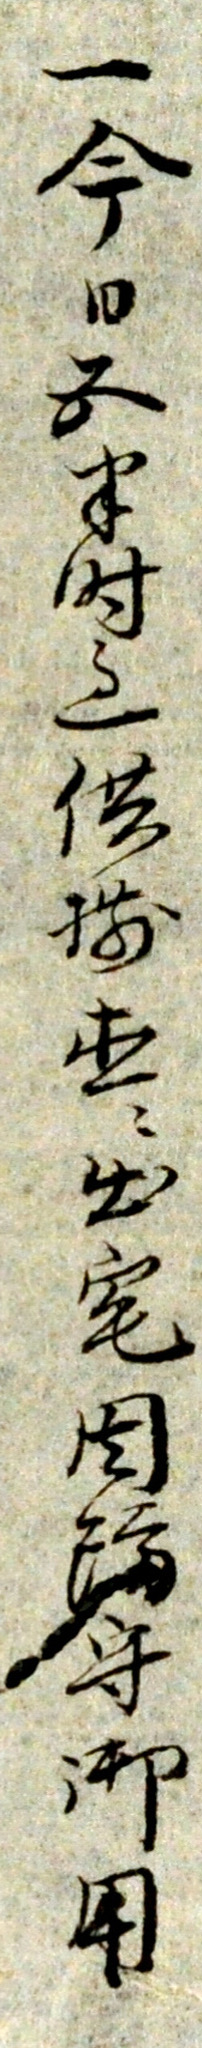一今日五半時過供揃直ニ出宅周防守御用
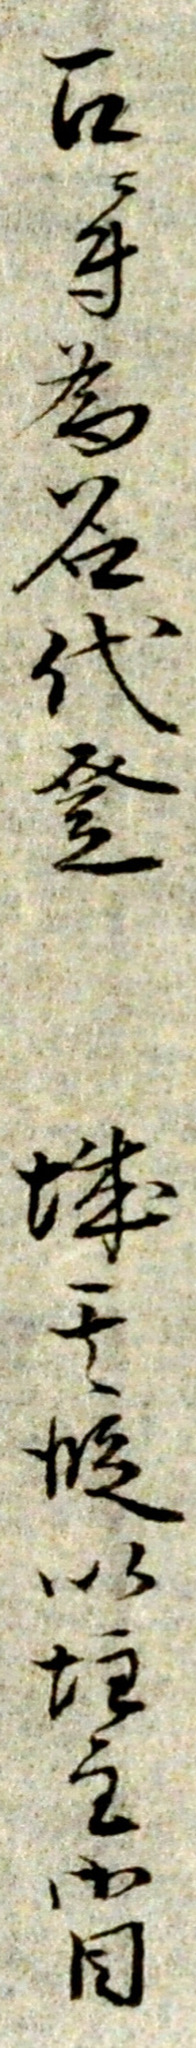召ニ付為名代登城其段以坊主御目
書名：諸名代相勤候節ノ留書外
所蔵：伊那市立高遠町図書館・合同会社AMANE
